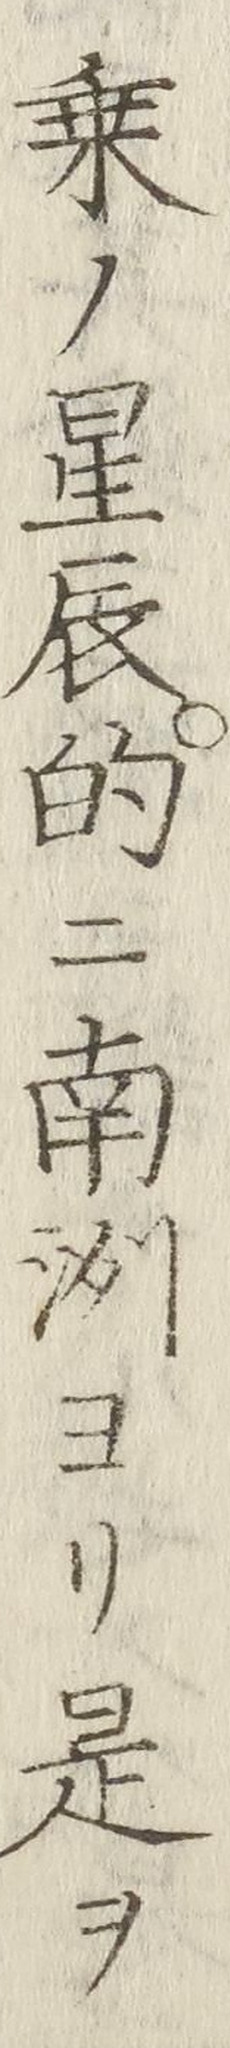乗ノ星辰。的ニ南洲ヨリ是ヲ
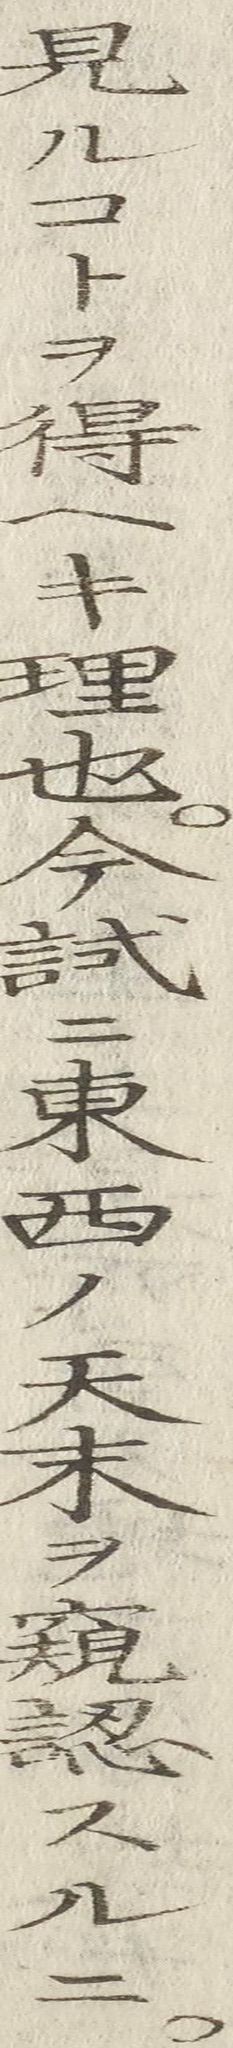見ルコトヲ得ヘキ理也。今試ニ東西ノ天末ヲ窺認スルニ。
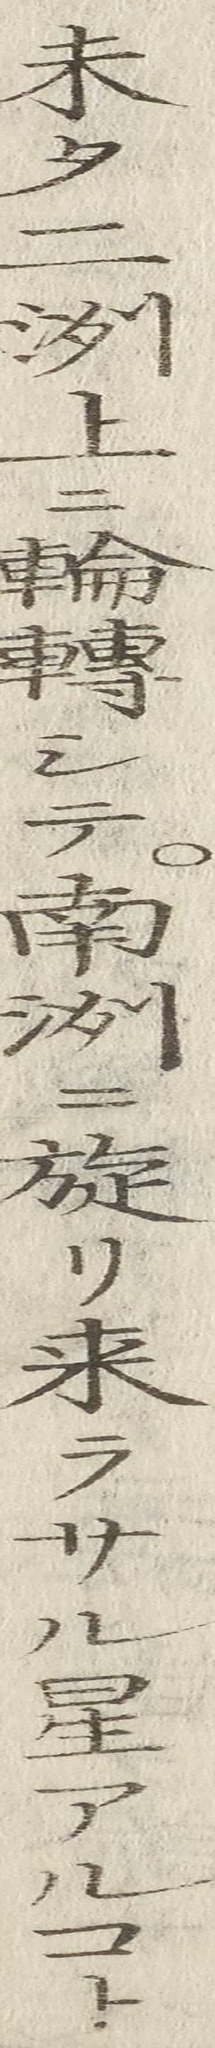未タニ洲上ニ輪転シテ。南洲ニ旋リ来ラサル星アルコト
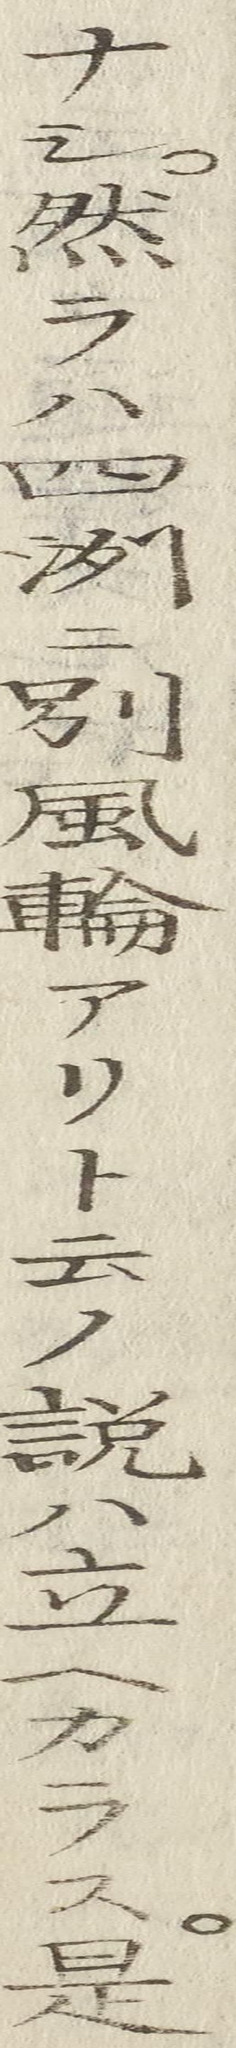ナシ。然ラハ四洲ニ別風輪アリト云ノ説ハ立ヘカラス。是

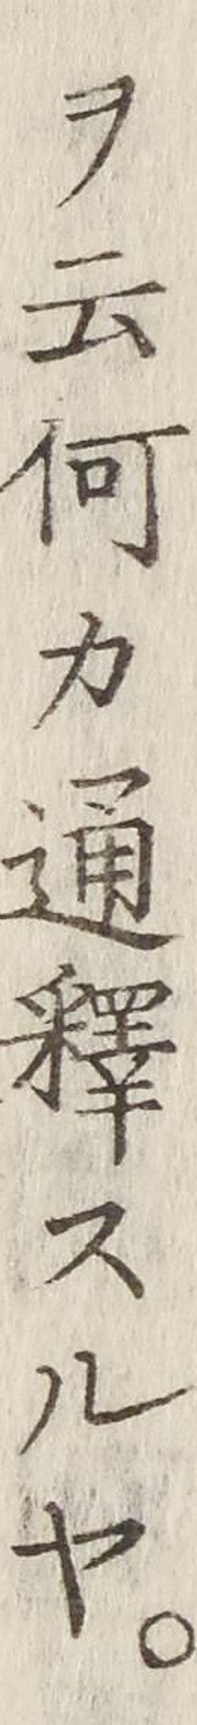ヲ云何カ通釈スルヤ。
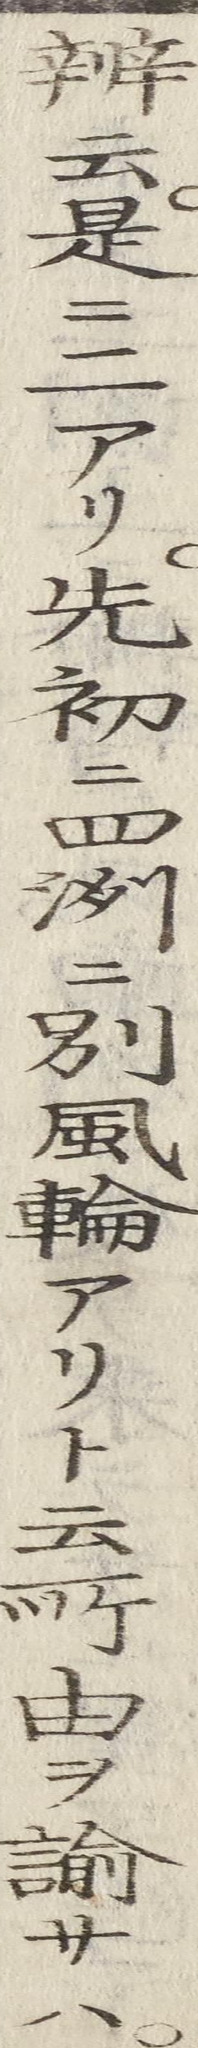弁云。是ニニアリ。先初ニ四洲ニ別風輪アリト云所由ヲ諭サハ。
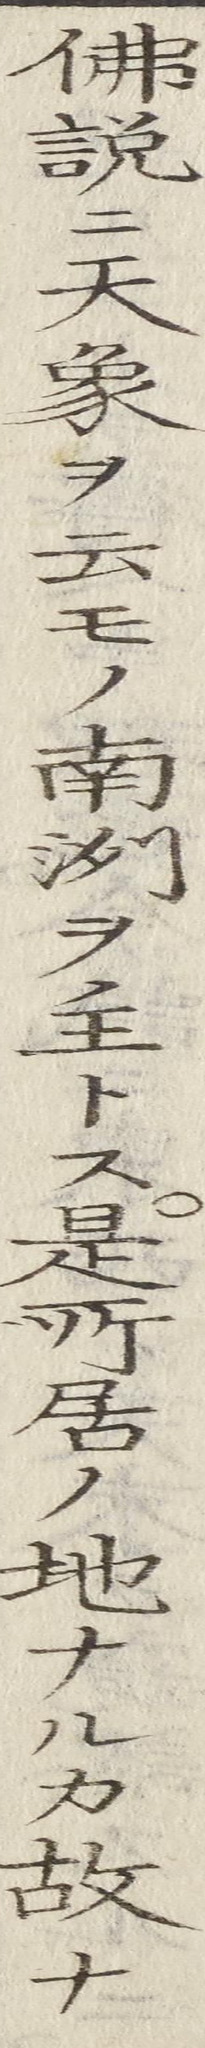仏説ニ天象ヲ云モノ南洲ヲ主トス。是所居ノ地ナルカ故ナ
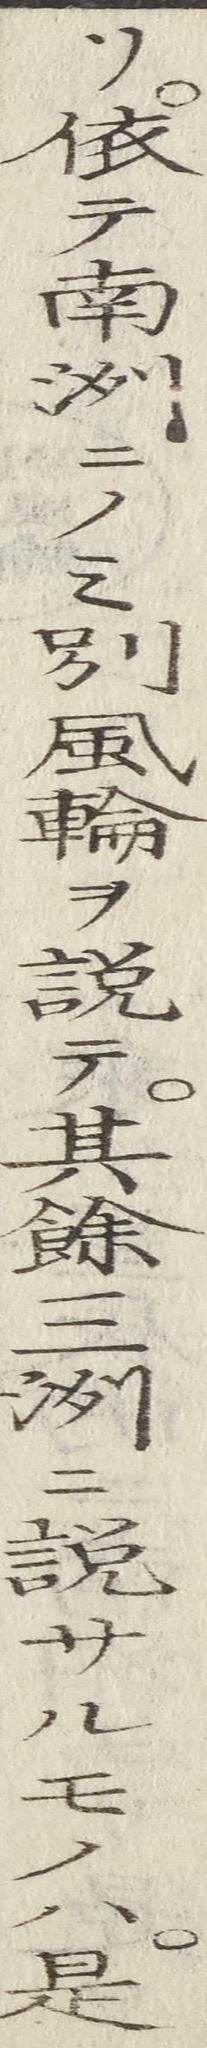リ。依テ南洲ニノミ別風輪ヲ説テ。其余三洲ニ説サルモノハ。是
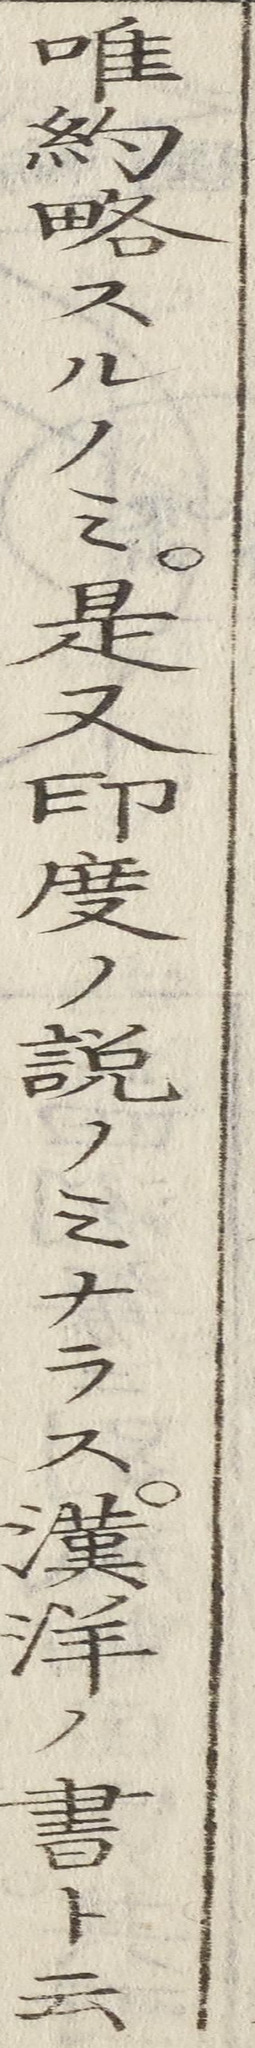唯約略スルノミ。是又印度ノ説ノミナラス。漢洋ノ書ト云
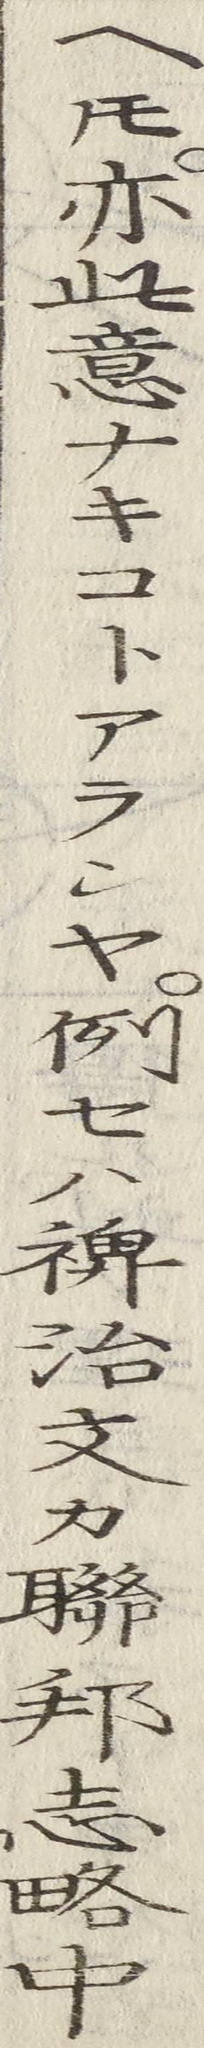ヘトモ。亦此意ナキコトアランヤ。例セハ裨治文カ聯邦志略中
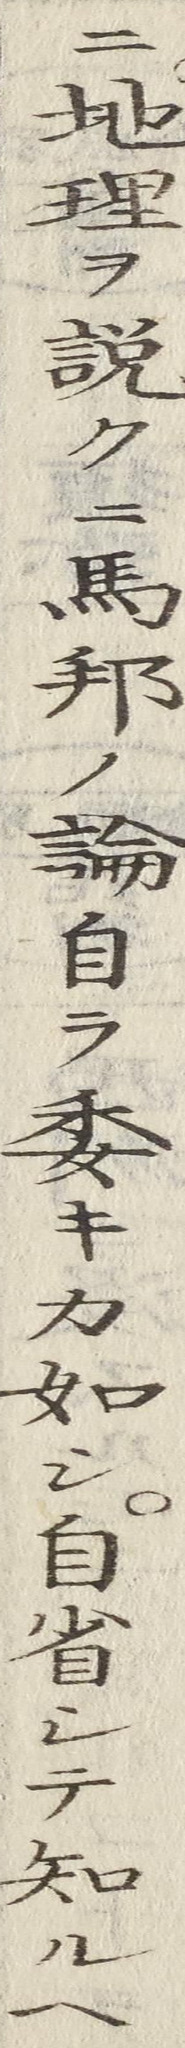ニ。地理ヲ説クニ馬邦ノ論自ラ委キカ如シ。自省シテ知ルヘ
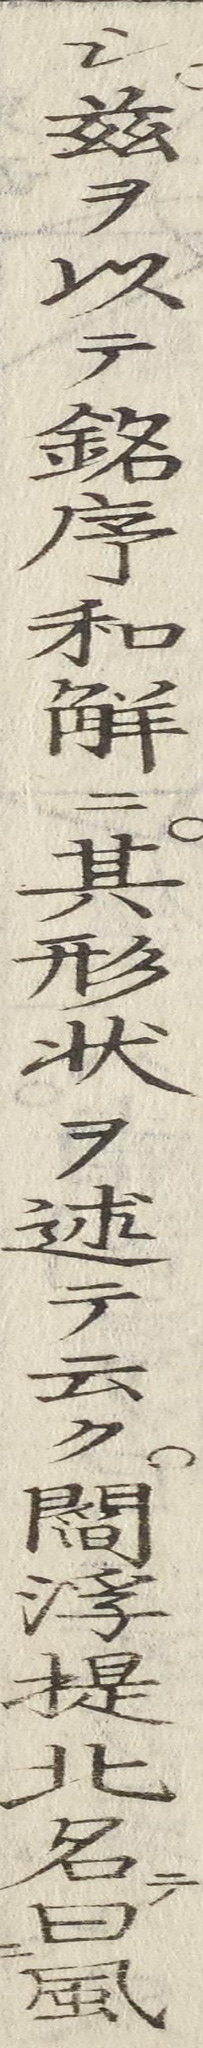シ。茲ヲ以テ銘序和觧ニ。其形状ヲ述テ云ク。閻浮提北名曰ニ風
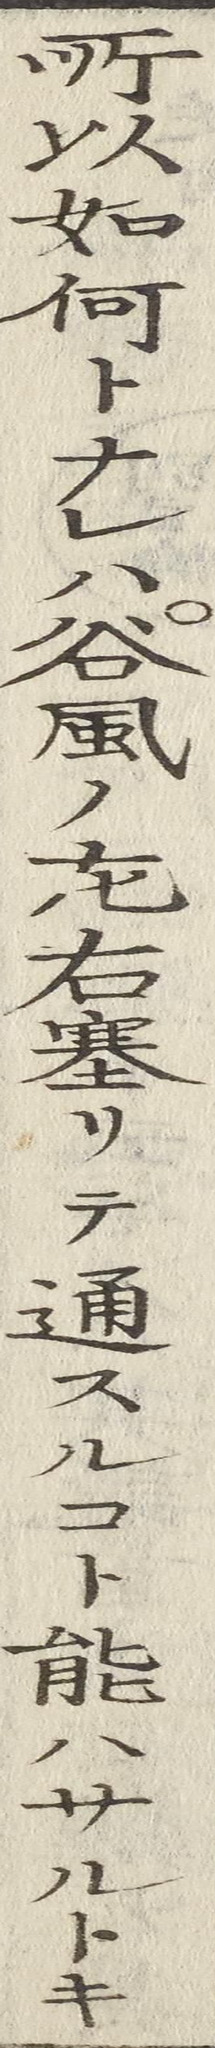所以如何トナレハ。俗風ノ左右塞リテ通スルコト能ハサルトキ
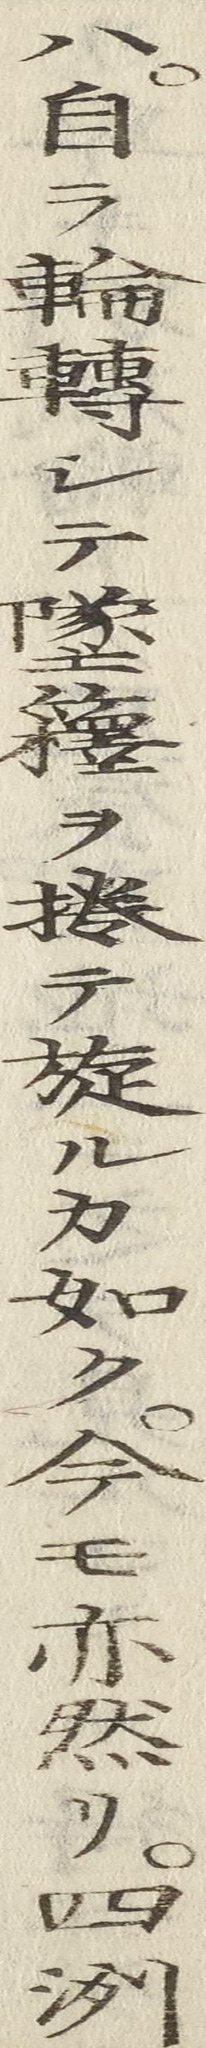ハ。自ラ輪転シテ墜籜ヲ捲テ旋ルカ如ク。今モ亦然リ。四洲
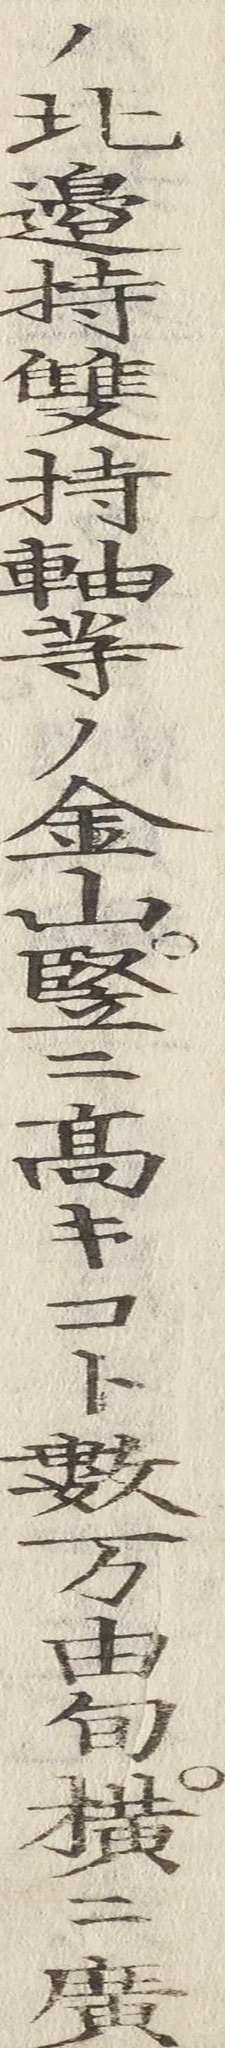ノ北辺持雙持軸等ノ金山。竪ニ高キコト数万由旬。横ニ広
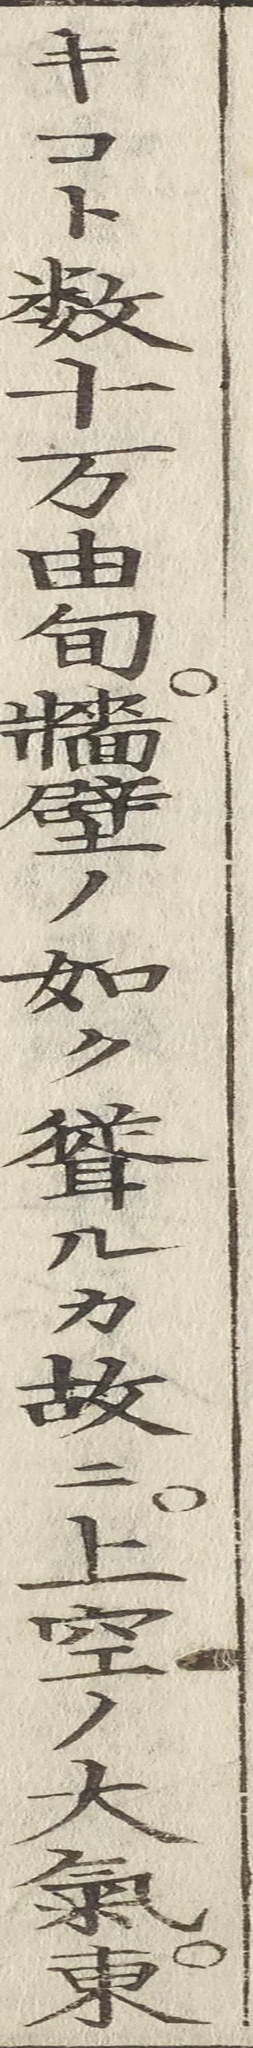キコト数十万由旬。牆壁ノ如ク聳ルカ故ニ。上空ノ大気。東
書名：護法新論　二編　上
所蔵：東京大学地震研究所図書室 Earthquake Research Institute Library, The University of Tokyo, JAPAN
